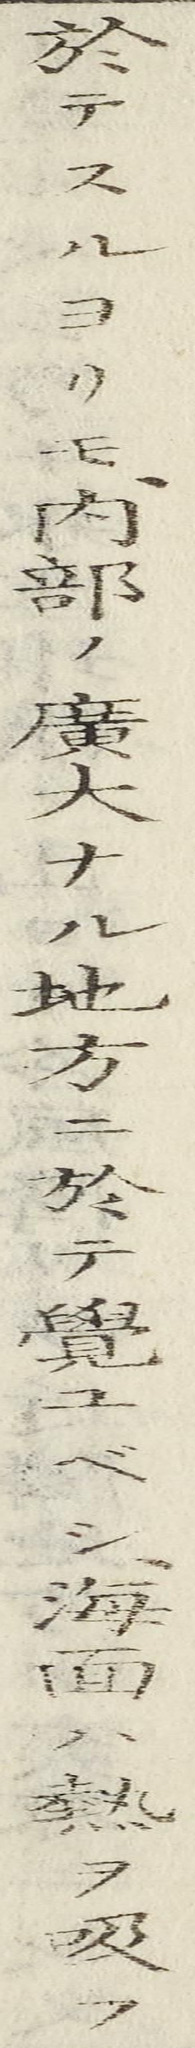於テスルヨリモ、内部ノ広大ナル地方ニ於テ覚ユベシ、海面ハ熱ヲ吸フ
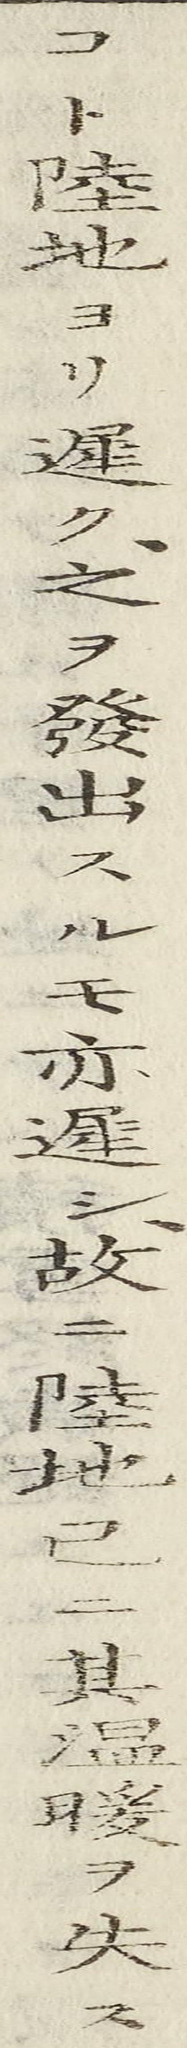コト陸地ヨリ遅ク、之ヲ発出スルモ亦遅シ、故ニ陸地已ニ其温暖ヲ失ス
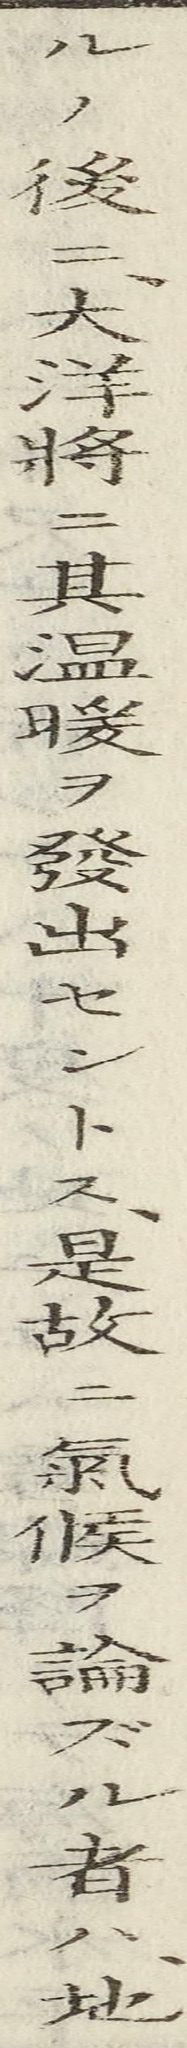ルノ後ニ、大洋将ニ其温暖ヲ発出セントス、是故ニ気候ヲ論ズル者ハ、地
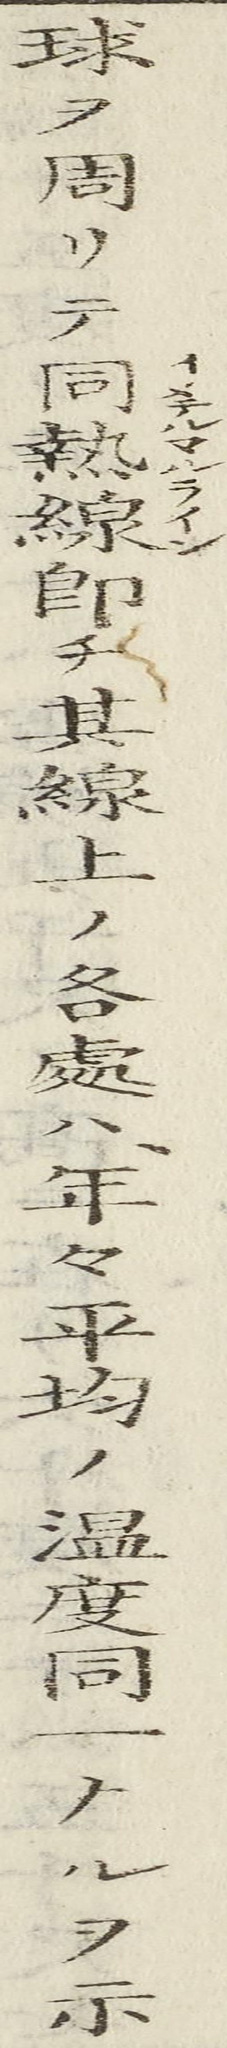球ヲ周リテ同熱線即チ其線上ノ各処ハ、年々平均ノ温度同一ナルヲ示
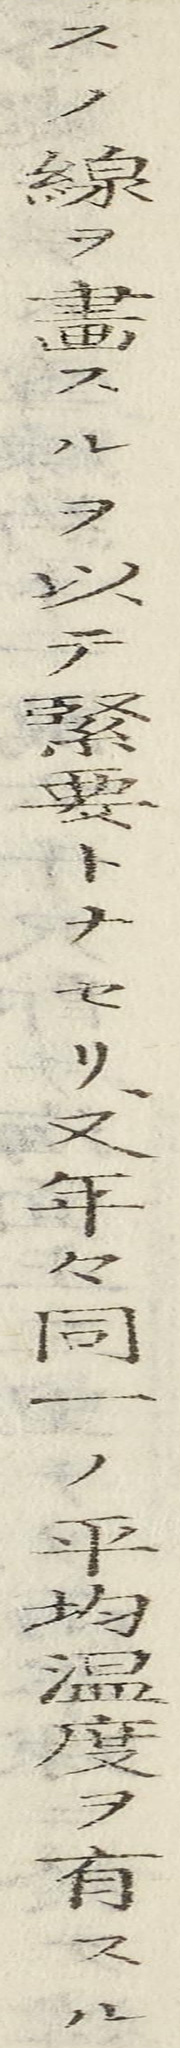スノ線ヲ画スルヲ以テ緊要トナセリ、又年々同一ノ平均温度ヲ有スル
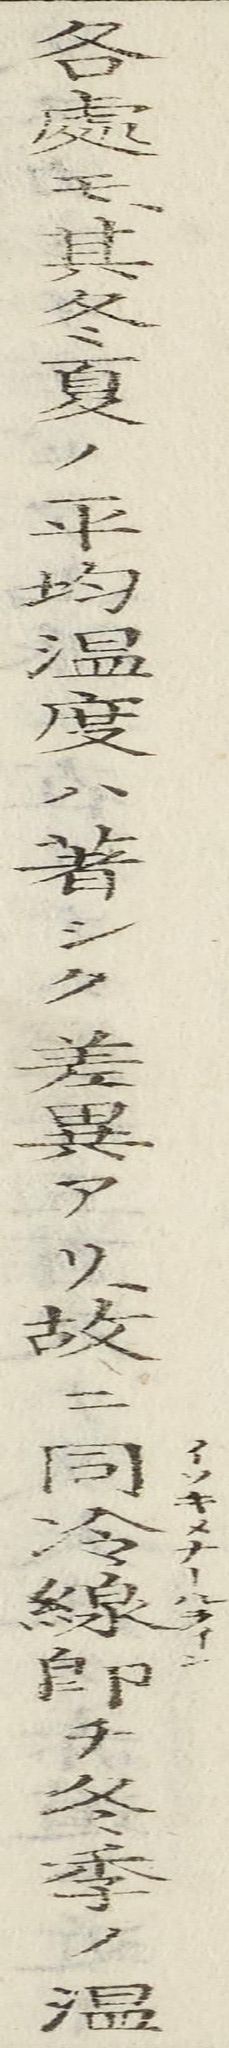各処モ、其冬夏ノ平均温度ハ著シク差異アリ、故ニ同冷線即チ冬季ノ温
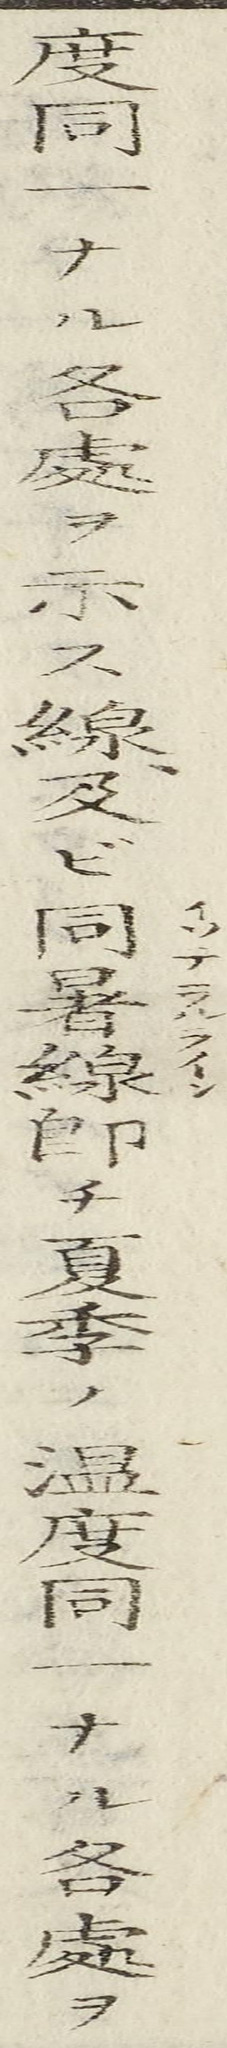度同一ナル各処ヲ示ス線、及ビ同暑線即チ夏季ノ温度同一ナル各処ヲ
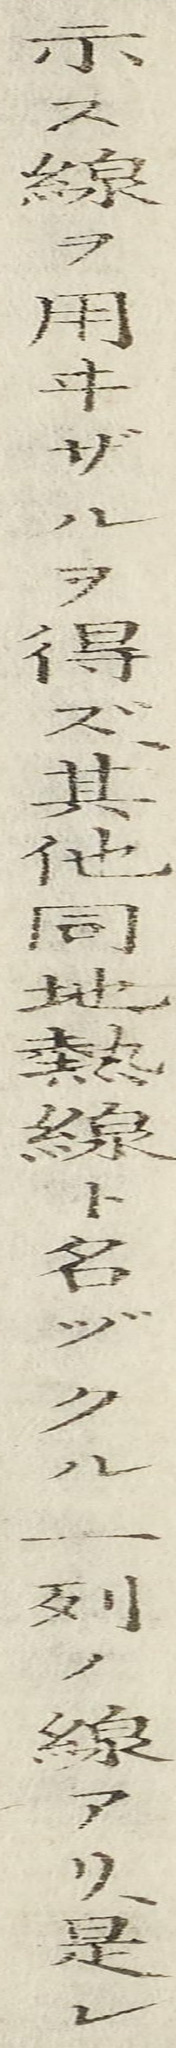示ス線ヲ用ヰザルヲ得ズ、其他同地熱線ト名ヅクル一列ノ線アリ、是レ
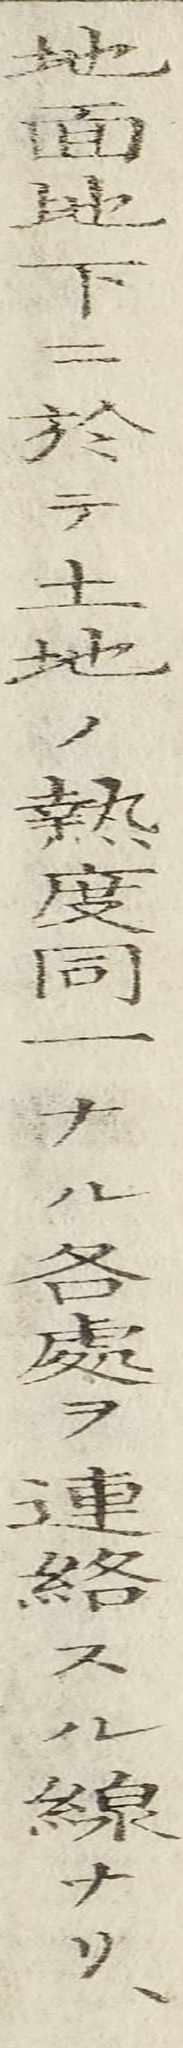地面地下ニ於テ土地ノ熱度同一ナル各処ヲ連絡スル線ナリ、
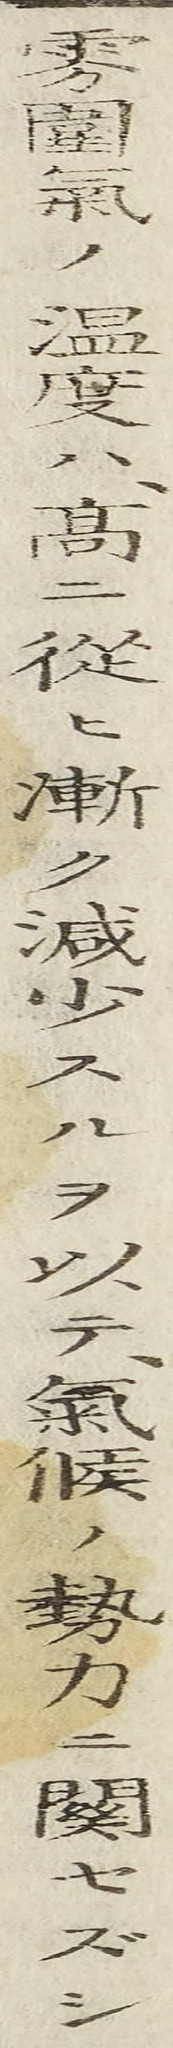雰囲気ノ温度ハ、高ニ従ヒ漸ク減少スルヲ以テ、気候ノ勢力ニ関セズシ

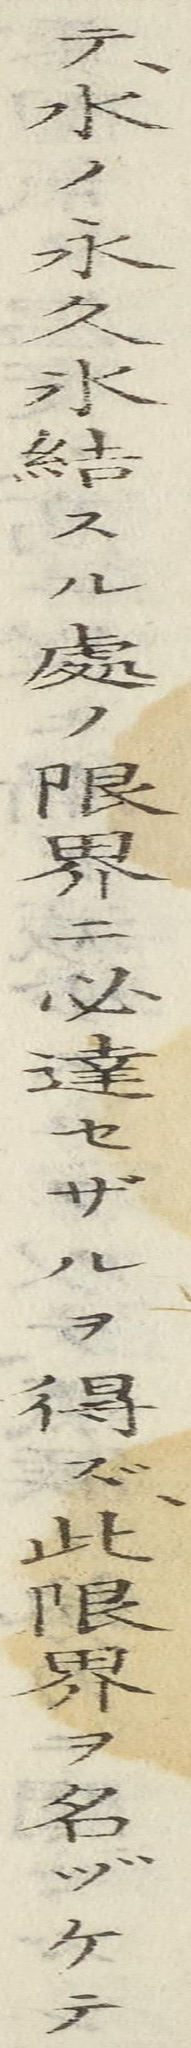テ、水ノ永久氷結スル処ノ限界ニ必達セザルヲ得ズ、此限界ヲ名ヅケテ
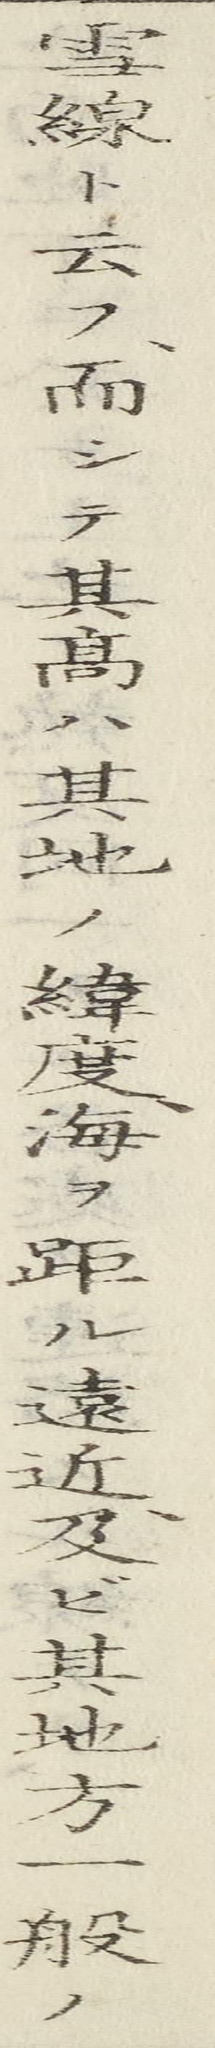雪線ト云フ、而シテ其高ハ其地ノ緯度、海ヲ距ル遠近、及ビ其地方一般ノ
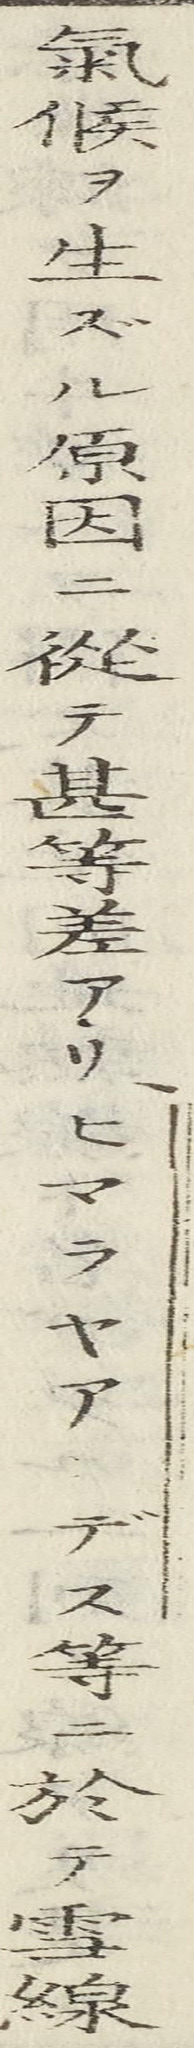気候ヲ生ズル原因ニ従テ甚等差アリ、ヒマラヤアデス等ニ於テ雪線
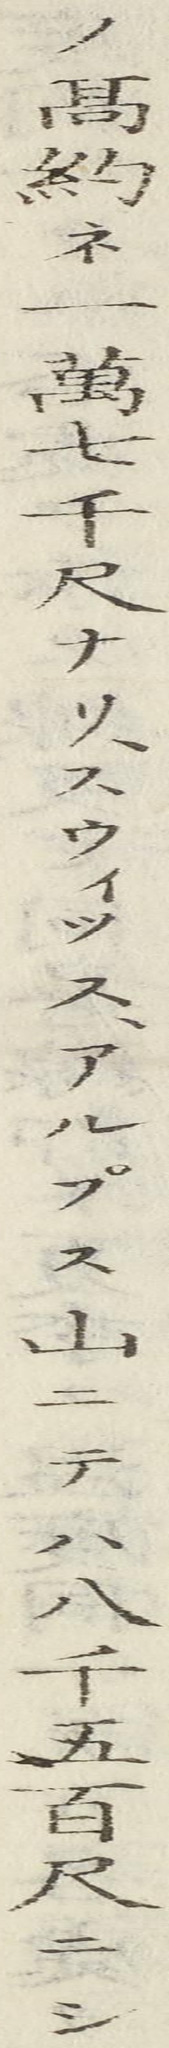ノ高約ネ一万七千尺ナリ、スウィツス、アルプス山ニテハ八千五百尺ニシ
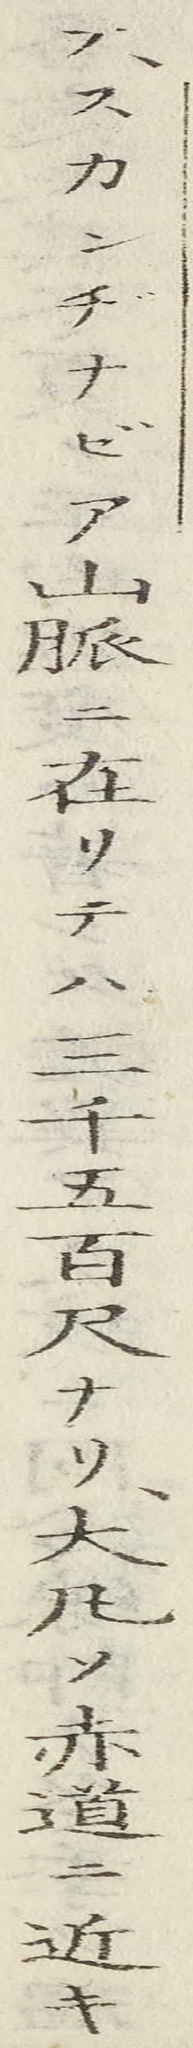テ、スカンヂナビア山脈ニ在リテハ三千五百尺ナリ、大凡ノ赤道ニ近キ
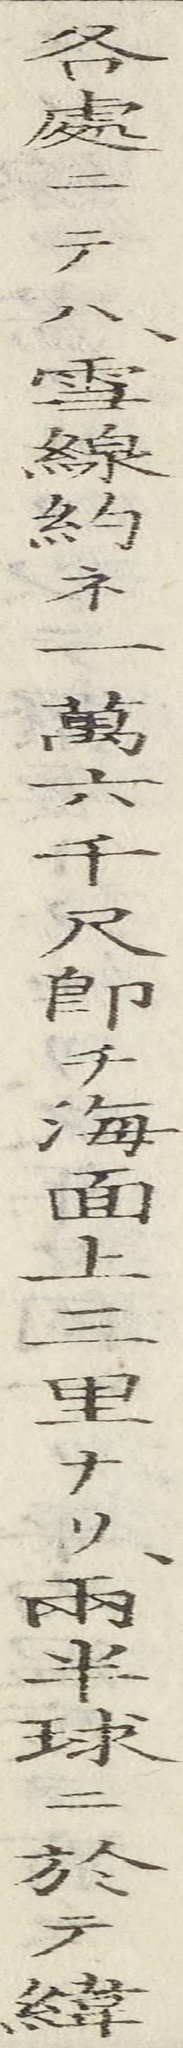各処ニテハ、雪線約ネ一万六千尺即チ海面上三里ナリ、両半球ニ於テ緯
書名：百科全書　地文學　全
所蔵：東京大学地震研究所図書室 Earthquake Research Institute Library, The University of Tokyo, JAPAN
